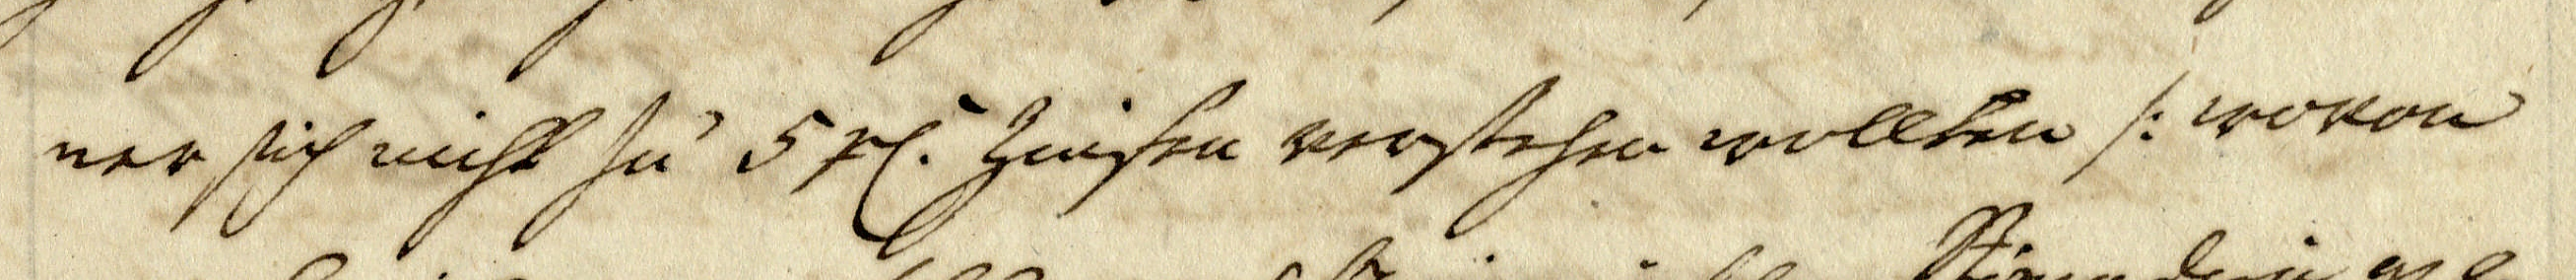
ner sich nicht zu 5 pl. Zinsen verstehen wollten /: wovon
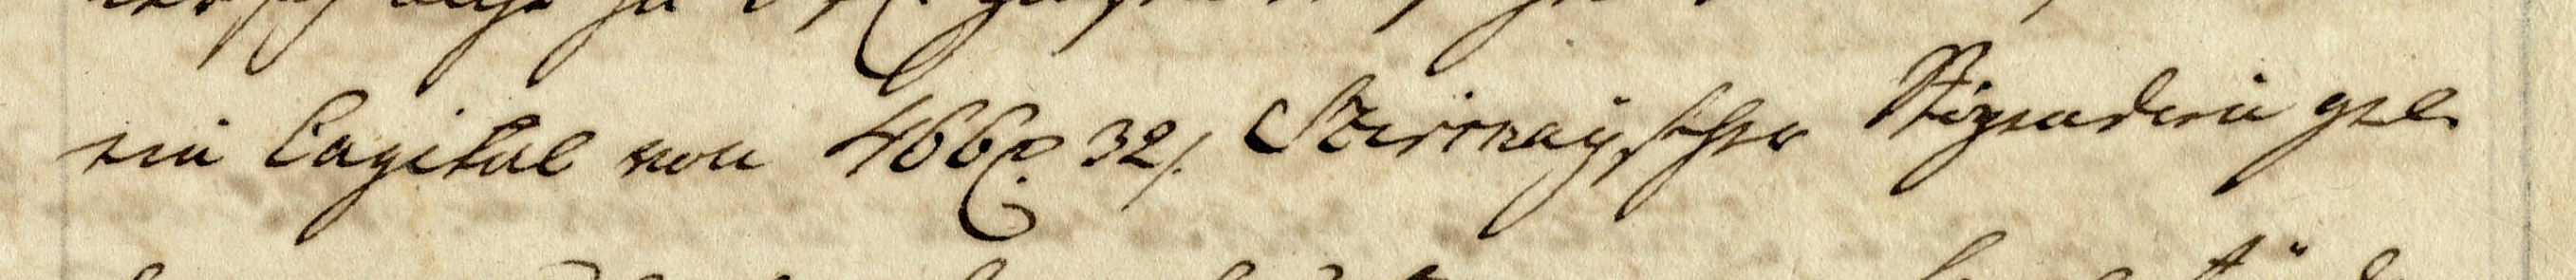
ein Capital von 466 l. 32 s. Szirmaÿscher Stipendiengel¬
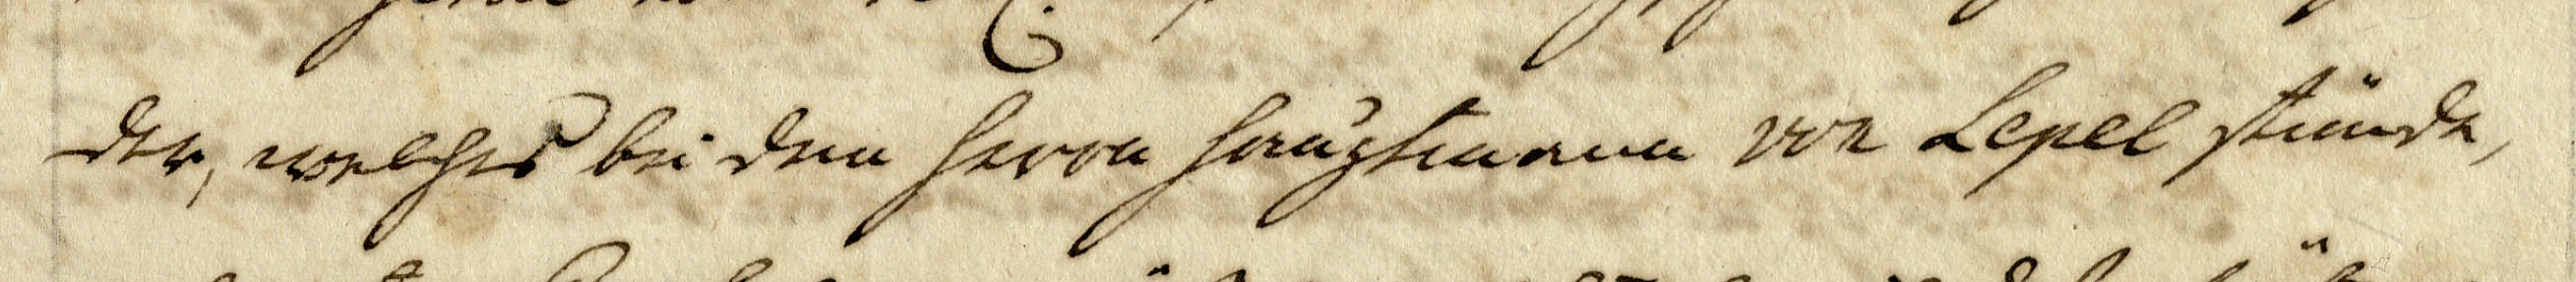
der, welches bei dem Herrn Hauptmann von Lepel stünde,
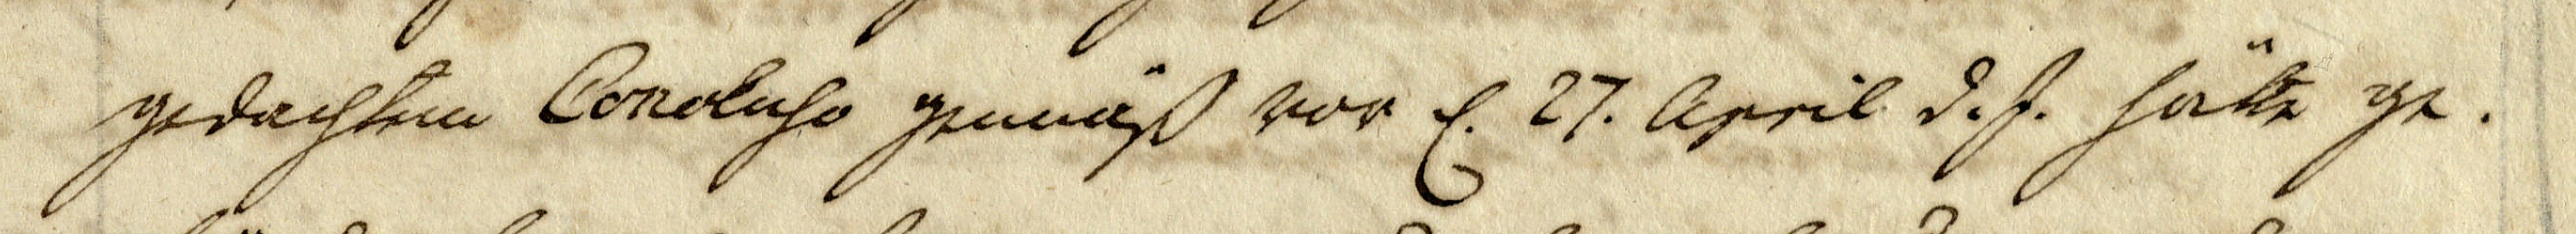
gedachtem Concluso gemäß vor l. 27. April d. J. hätte ge¬
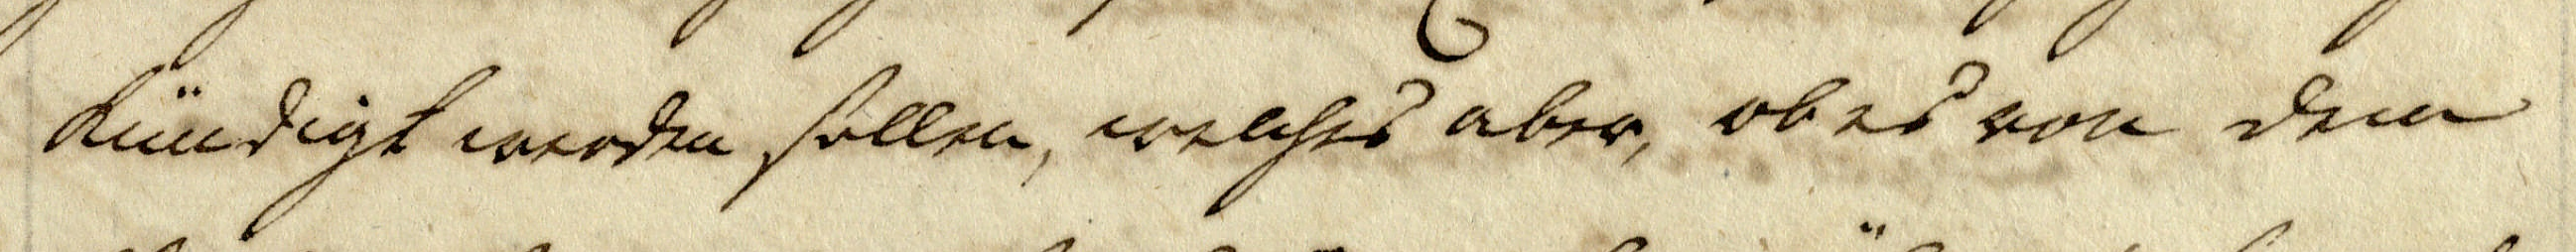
kündiget werden sollen, welches aber, ob es von dem
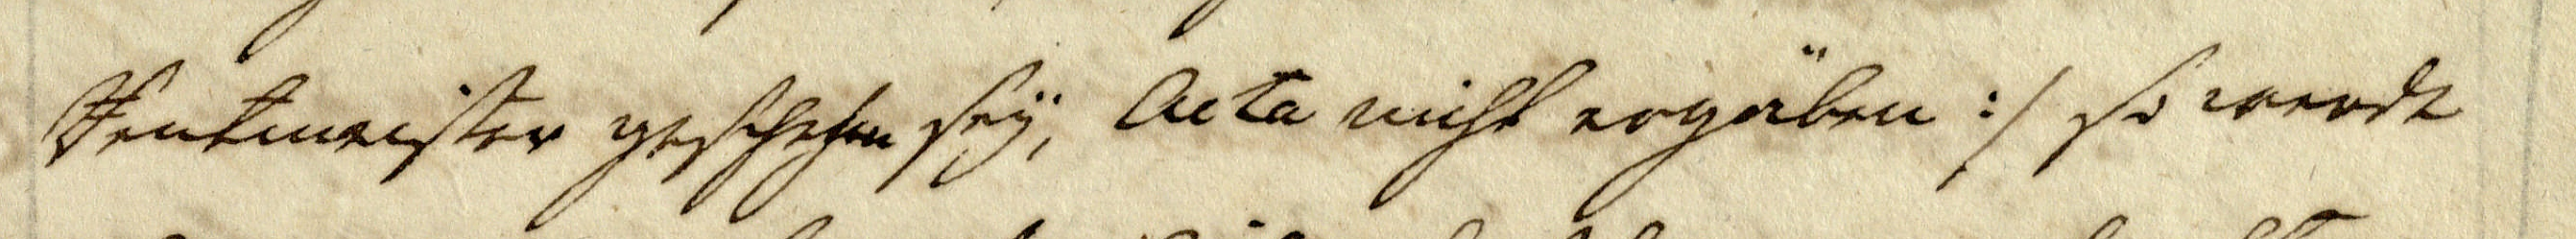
Rentmeister geschehen seÿ, Acta nicht ergäben :/ so werde
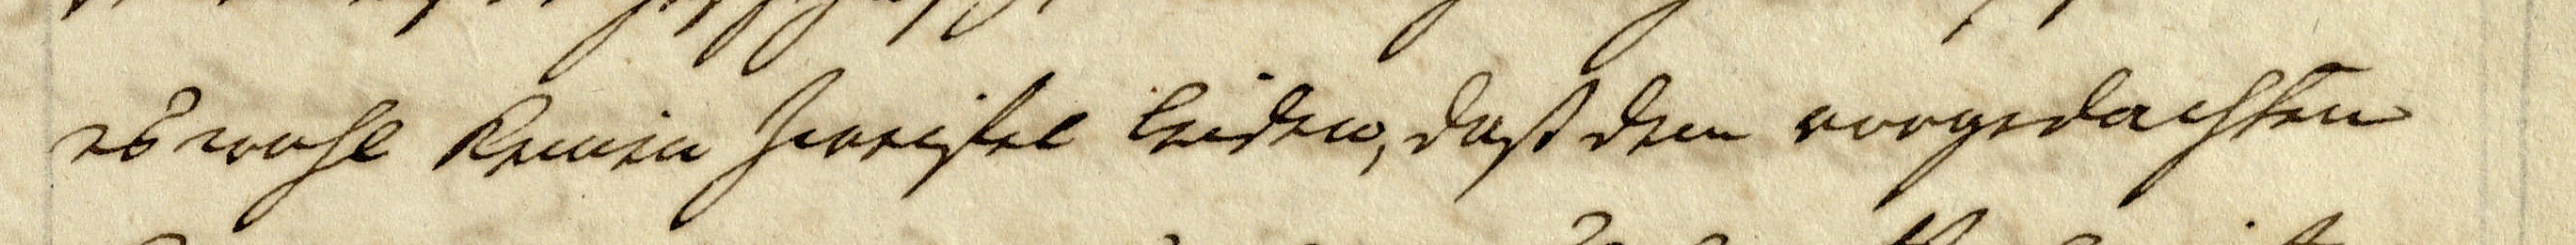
es wohl keinen Zweifel leiden, daß dem vorgedachten
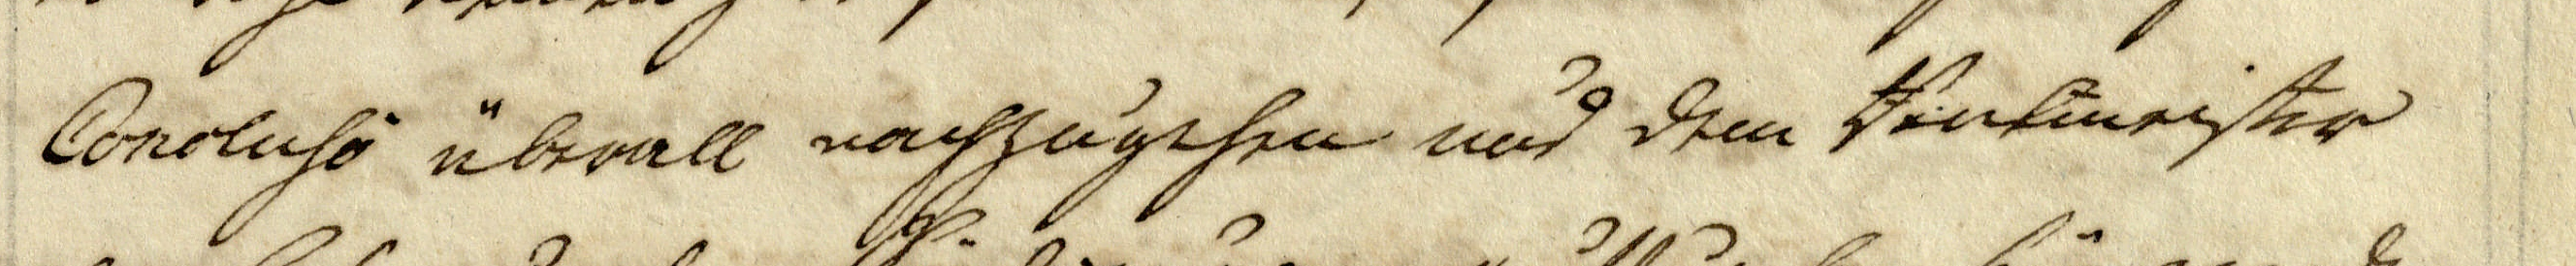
Concluso überall nachzugehen und dem Rentmeister
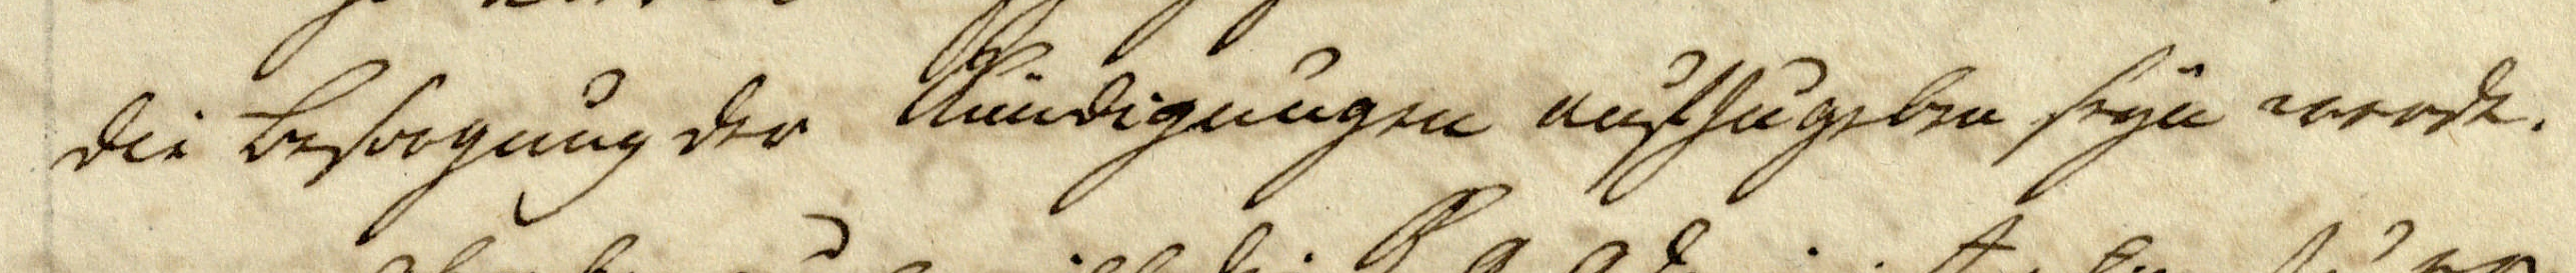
die Besorgung der Kündigungen aufzugeben seÿn werde.
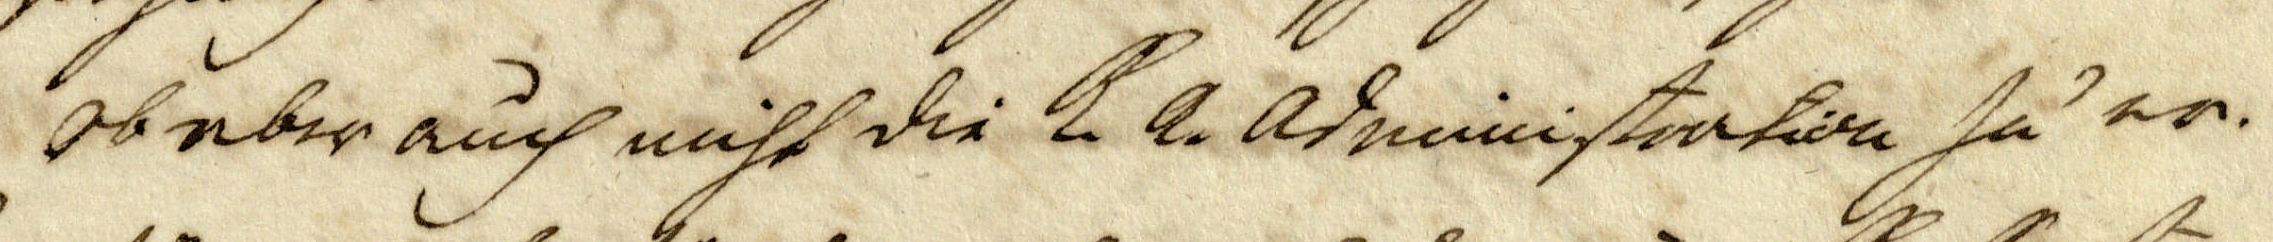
ob aber auch nicht die K. A. Administration zu er¬
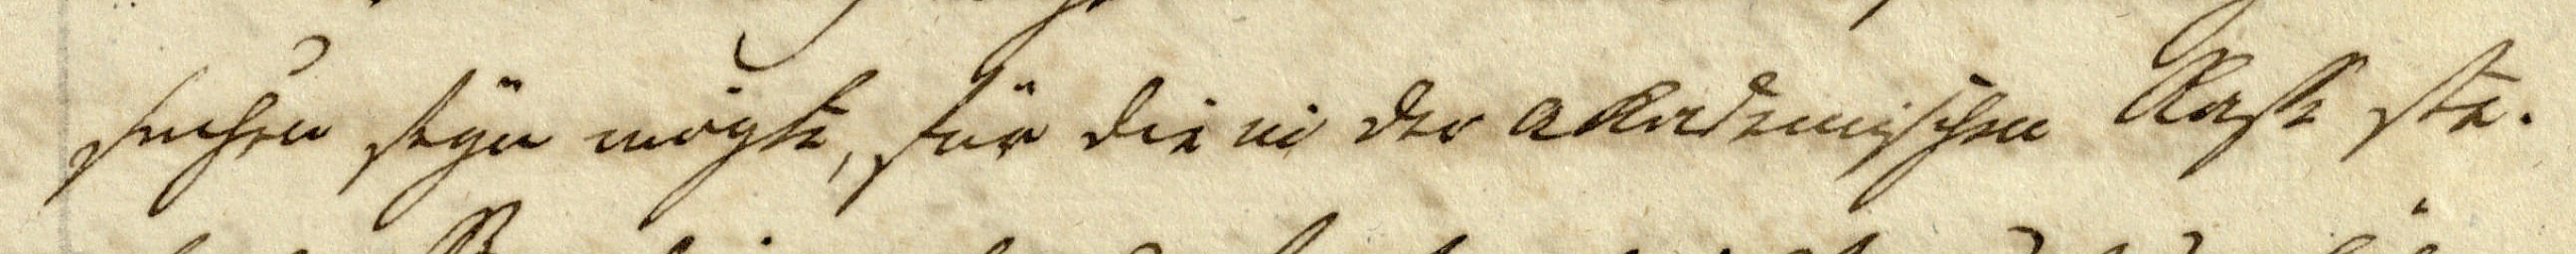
suchen seÿn mögte, für die in der akademischen Kasse ste¬
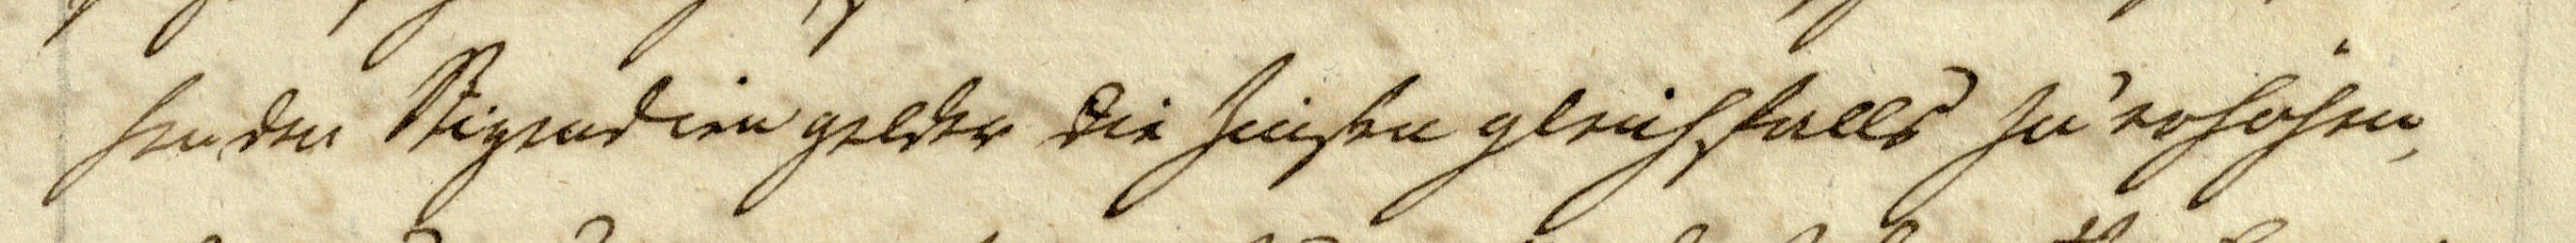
henden Stipendiengelder die Zinsen gleichfalls zu erhöhen,
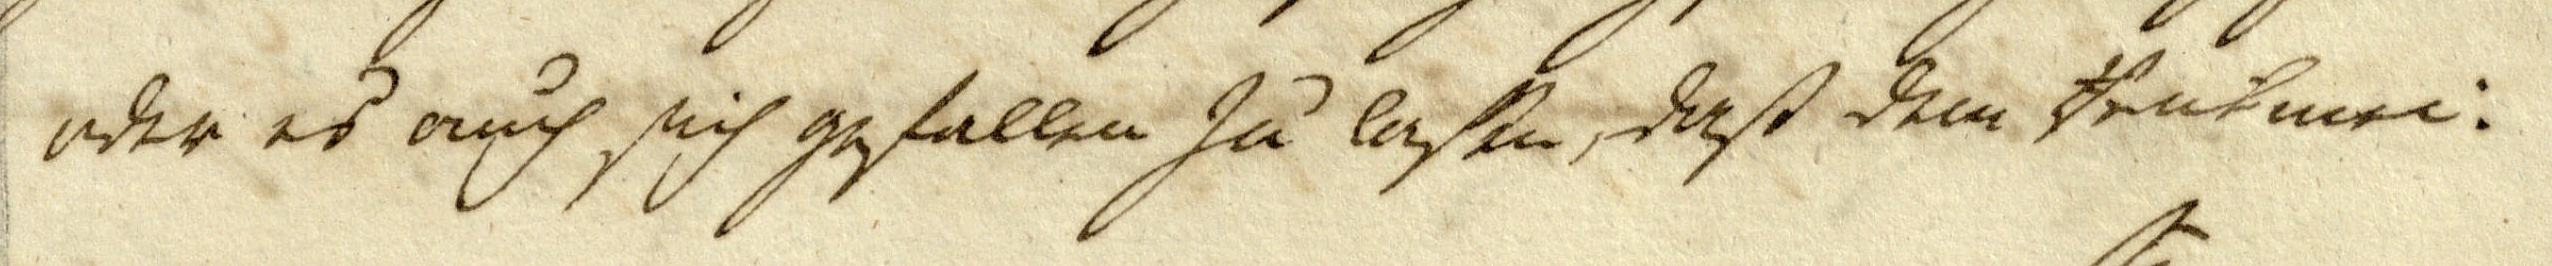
oder es auch sich gefallen zu lassen, daß dem Rentmei¬
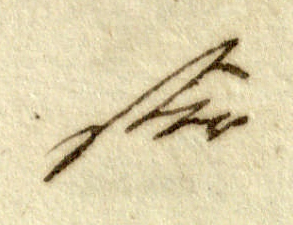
ster
